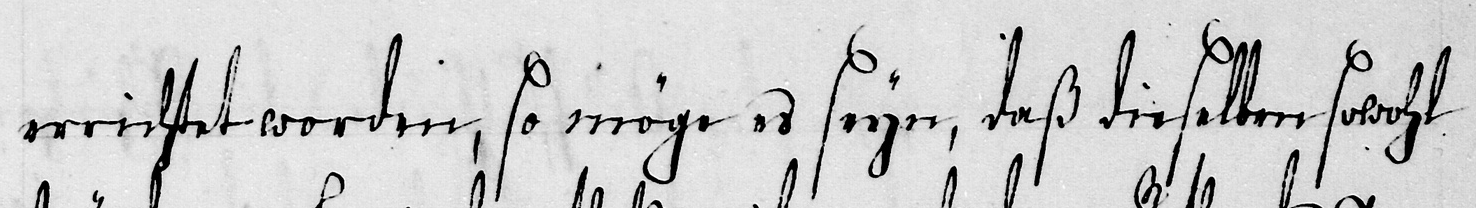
errichtet worden, so möge es seyn, daß dieselben sowohl
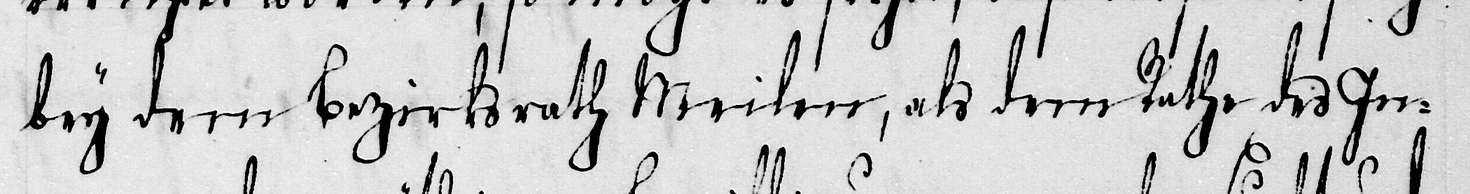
bey dem Bezirksrath Meilen, als dem Rathe des In¬
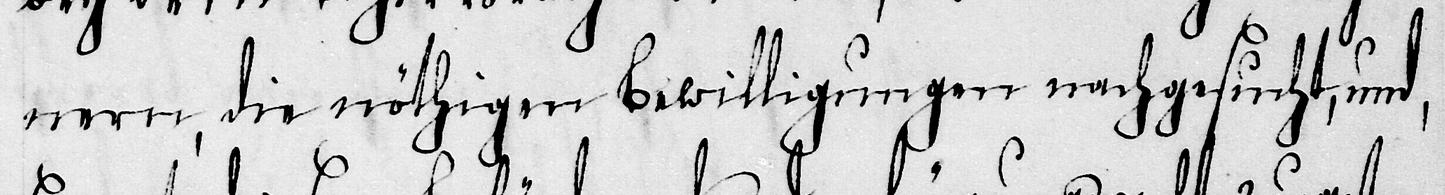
nern, die nöthigen Bewilligungen nachgesucht, und,
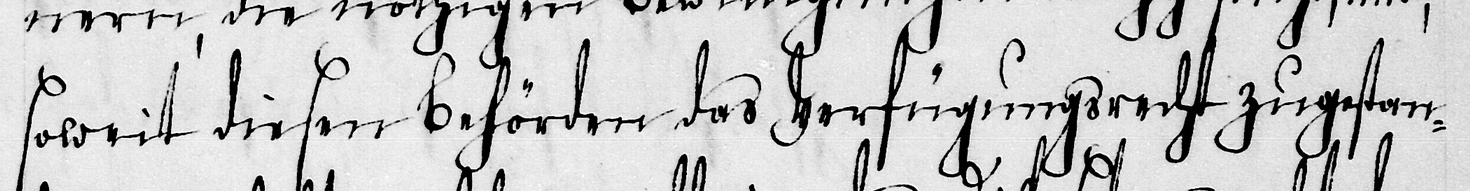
soweit diesen Behörden das Verfügungsrecht zugestan¬
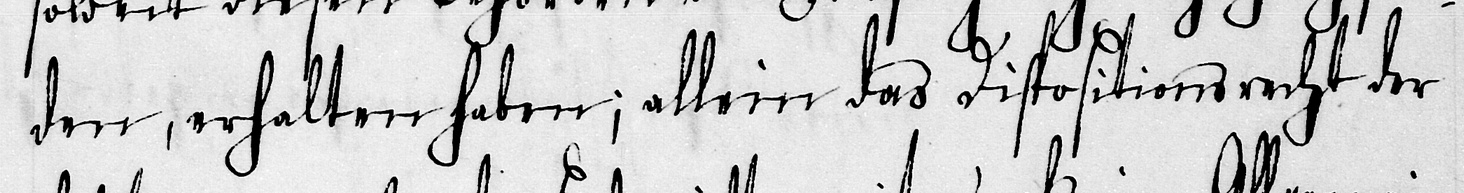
den, erhalten haben; allein das Dispositionsrecht der
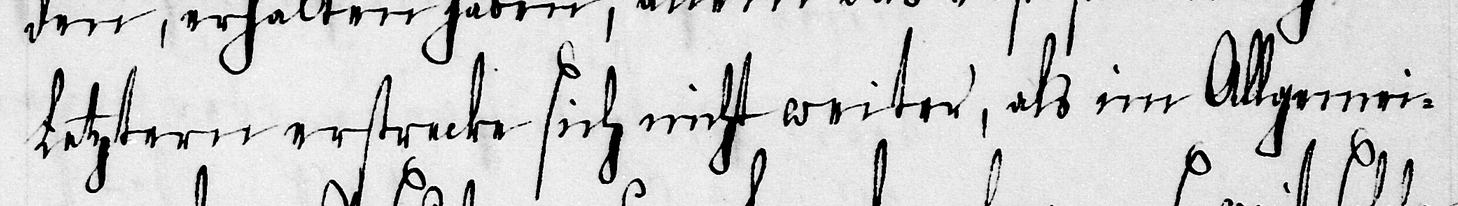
Letztern erstrecke sich nicht weiter, als im Allgemei¬
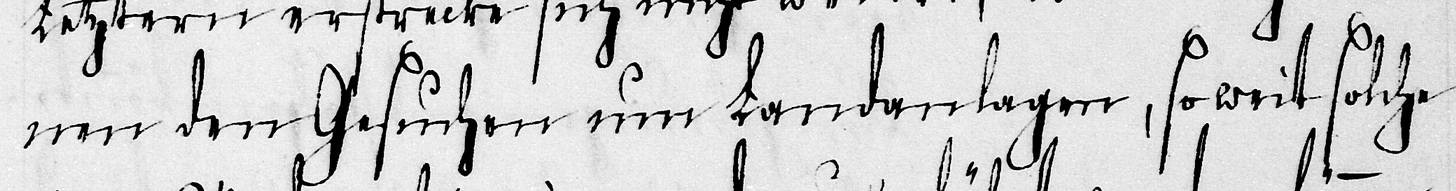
nen den Gesuchen um Landanlagen, so weit solche
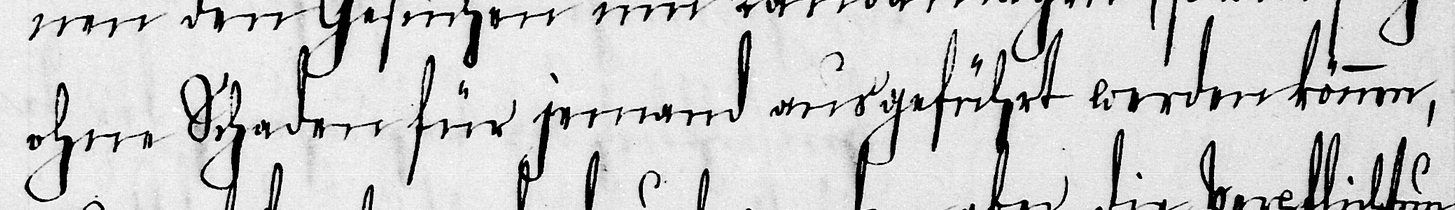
ohne Schaden für jemand ausgeführt werden können,
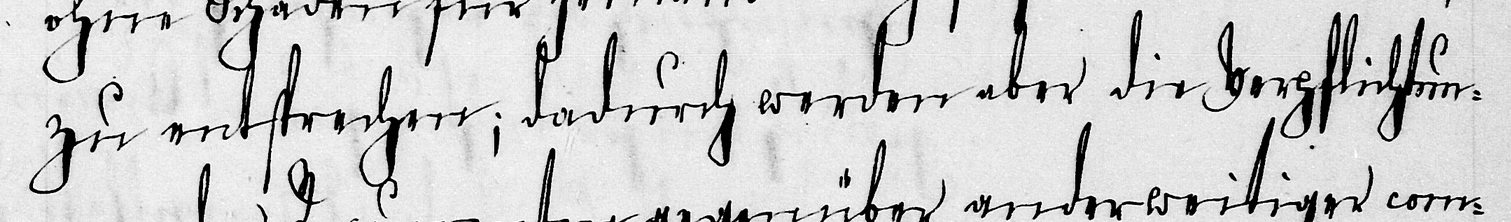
zu entsprechen; dadurch werden aber die Verpflichtun¬
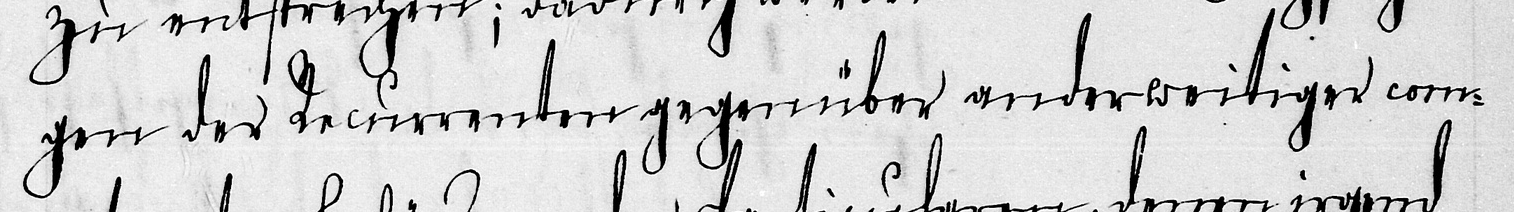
gen der Recurrenten gegenüber anderweitiger com¬
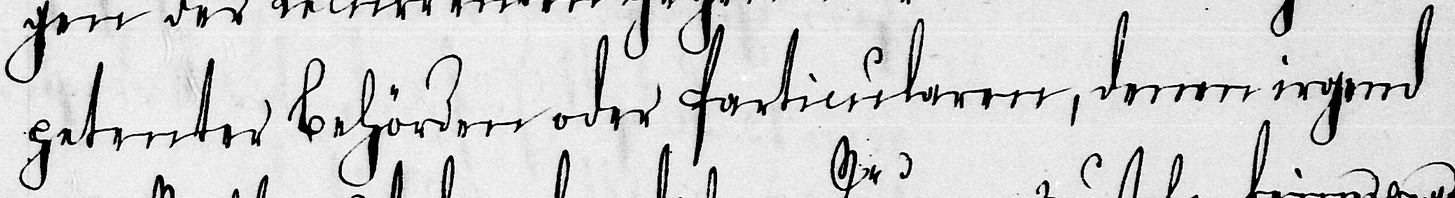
petenter Behörden oder Particularen, denen irgend
